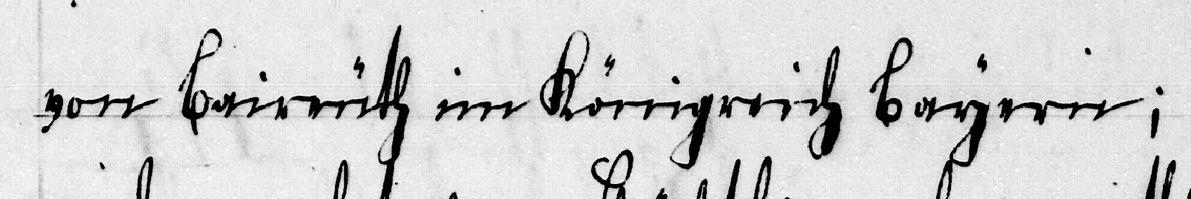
von Baireuth im Königreich Bayern;
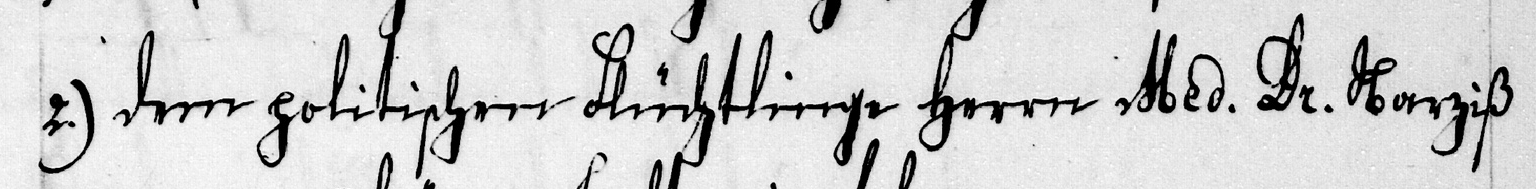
2.) dem politischen Flüchtlinge Herrn Med. Dr. Narziß
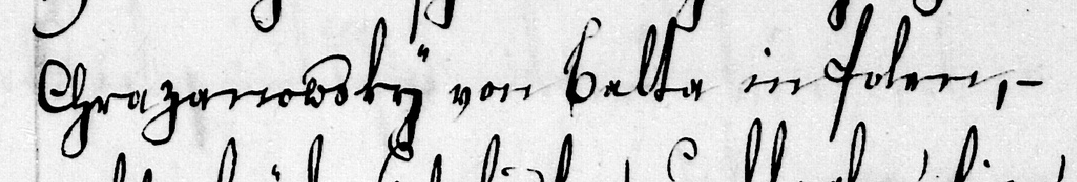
Chrazanowsky von Balta in Polen, –
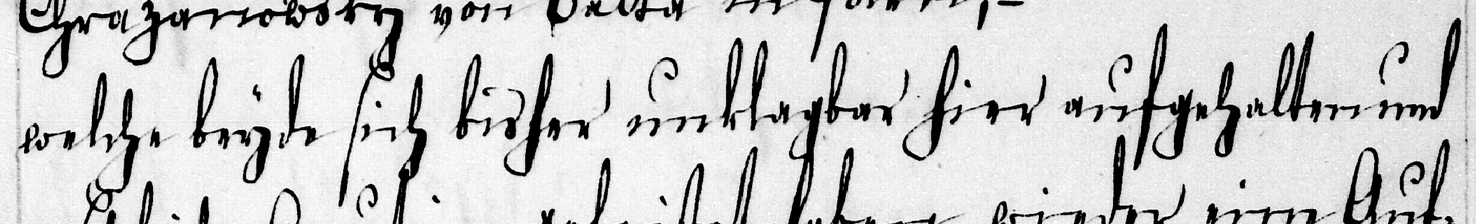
welche beyde sich bisher unklagbar hier aufgehalten und
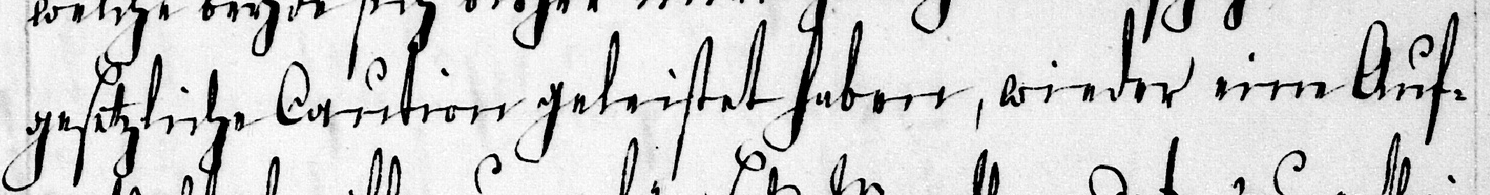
gesetzliche Caution geleistet haben, wieder eine Auf¬
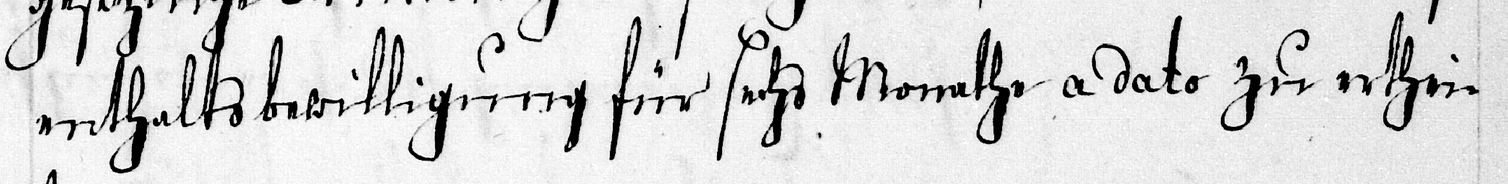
enthaltsbewilligung für sechs Monathe a dato zu erthei¬
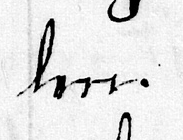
len.
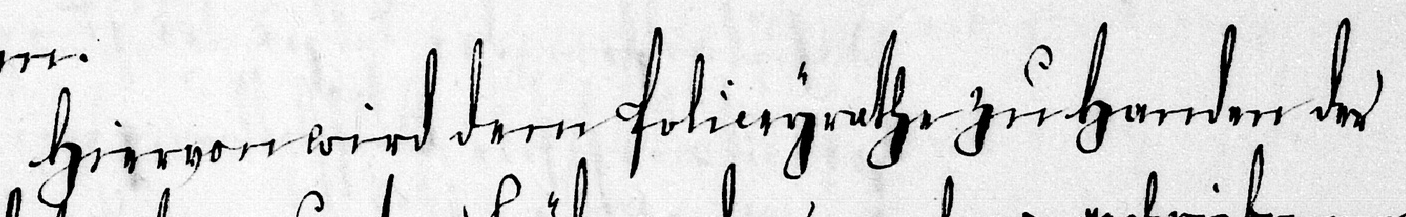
Hiervon wird dem Policeyrathe zu Handen der
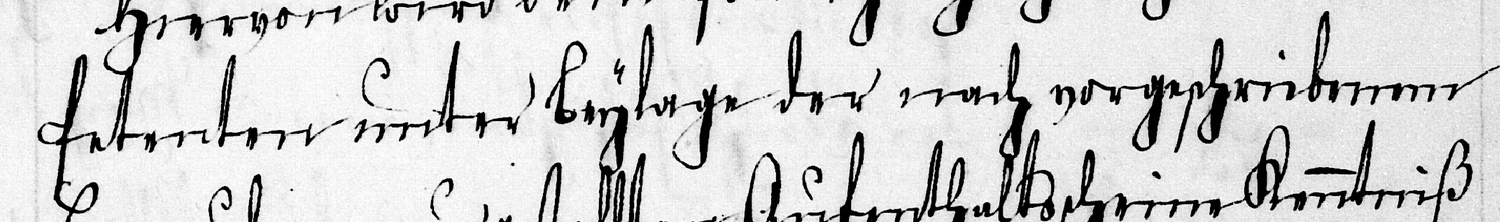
Petenten unter Beylage der nach vorgeschriebenem
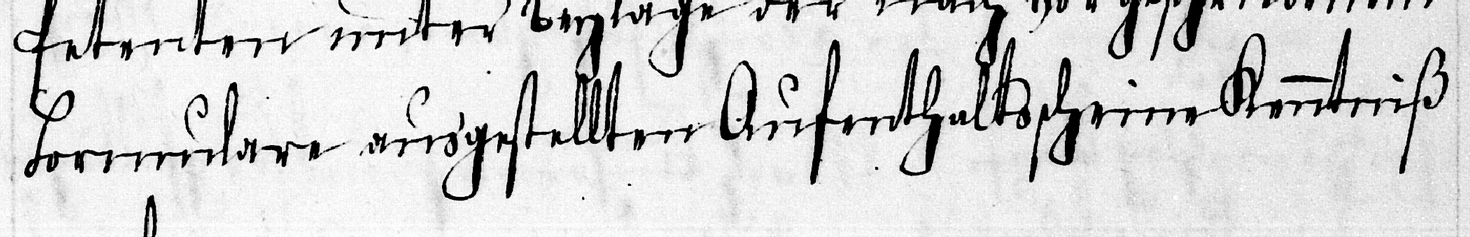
Formulare ausgestellten Aufenthaltsscheine Kenntniß
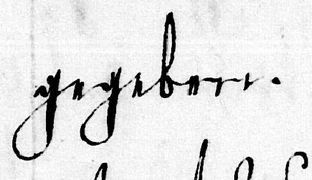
gegeben.
